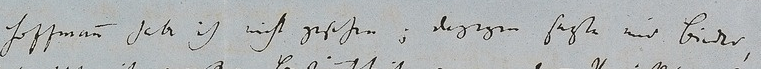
Hoffmann habe ich nicht gesehen; dagegen sagte mir Bieder,
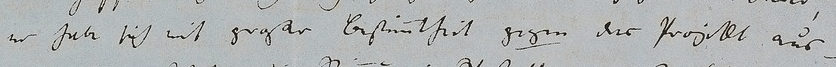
er habe sich mit großer Bestimmtheit gegen das Projekt aus-
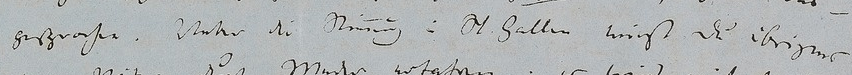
gesprochen. Ueber die Stimmung in St. Gallen wirst Du übrigens
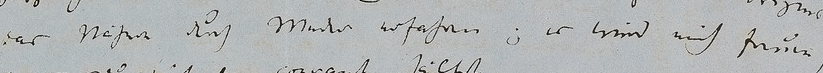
das Nähere durch Weder erfahren; es wird mich freuen,
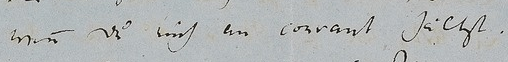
wenn Du mich au courant hältst.
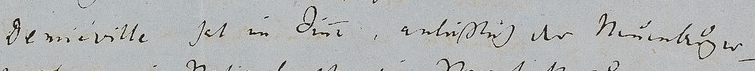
Demiéville hat im Sinne, anläßlich der Neuenburger -
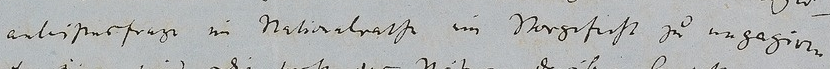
anleihensfrage im Nationalrathe ein Vorgefecht zu engagiren.
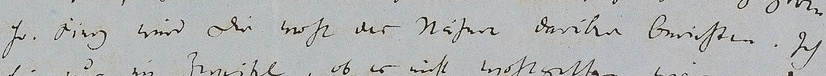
Hr. Fierz wird Dir wohl das Nähere darüber berichten. Ich
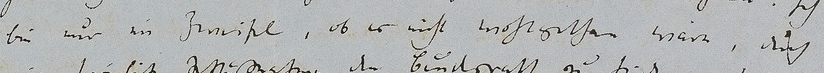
bin nur im Zweifel, ob es nicht wohlgethan wäre, durch
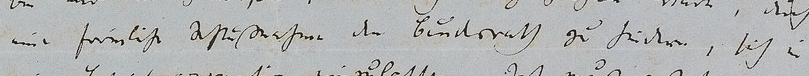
eine förmliche Schlußnahme den Bundesrath zu hindern, sich in
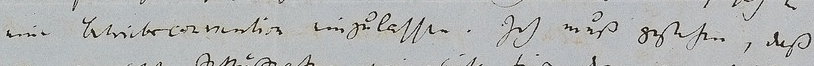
eine Betriebsconvention einzulassen. Ich muß gestehen, daß
